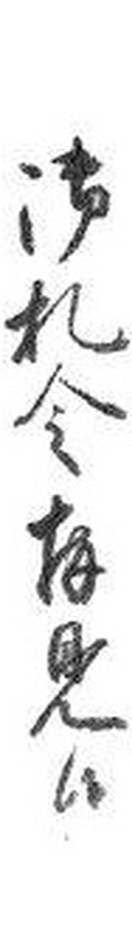御札令拝見候
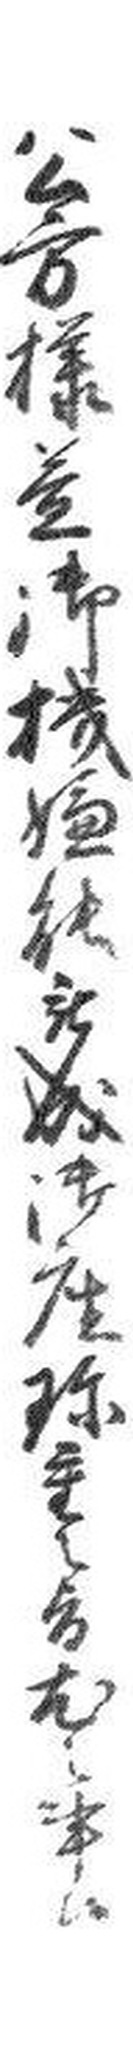公方様益御機嫌能被成御座珎重候旨尤之事候
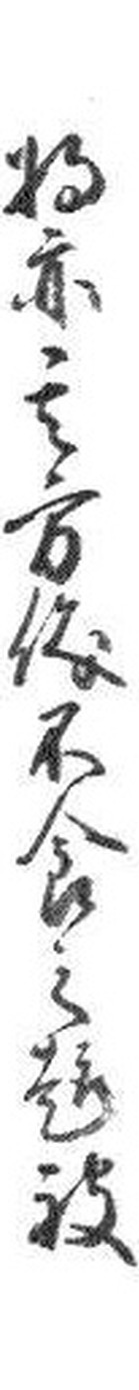将亦其方儀不食之趣被
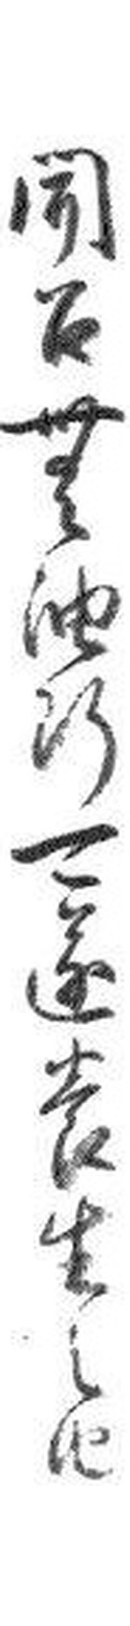聞召無油断可遂養生之由
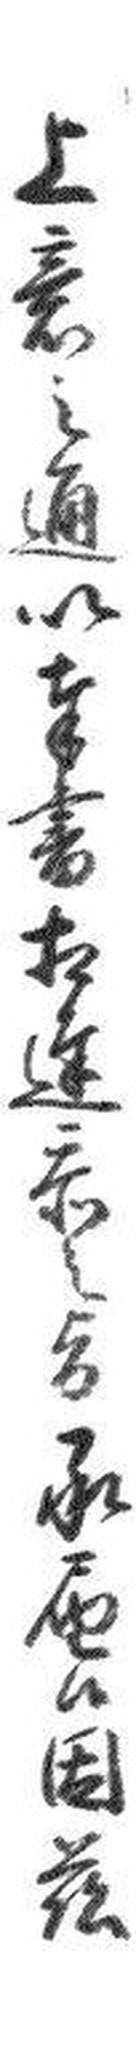上意之通以奉書相達忝之旨承届候因茲
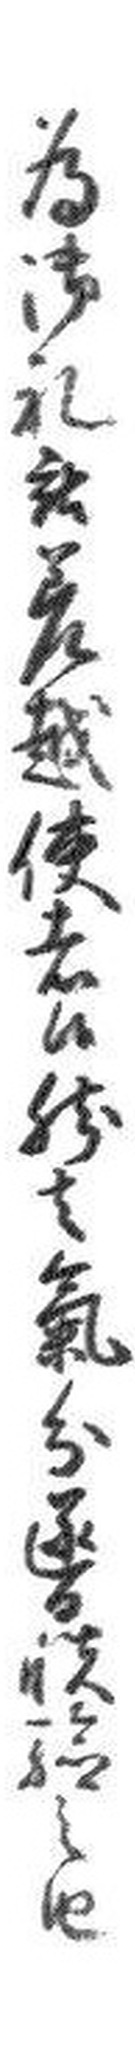為御礼被差越使者候然者気分逐日快験之由
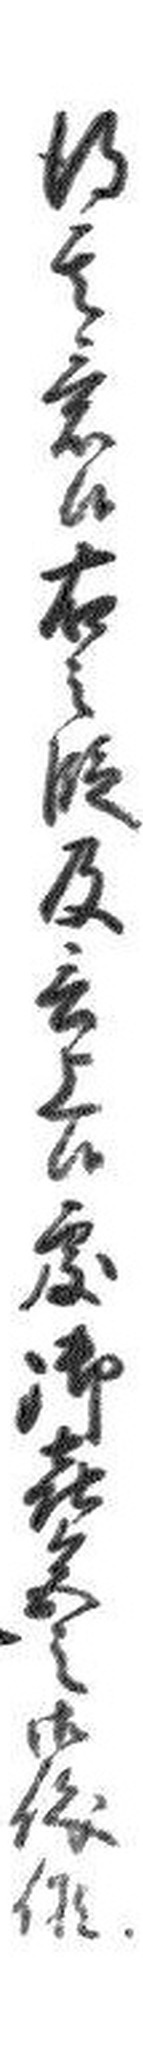得其意候右之段及言上候処御喜色之御儀候
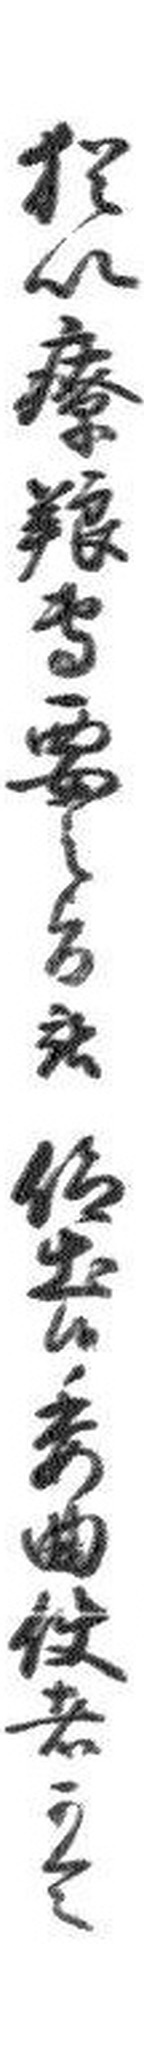猶以療養専要之旨被仰出候委曲使者可令
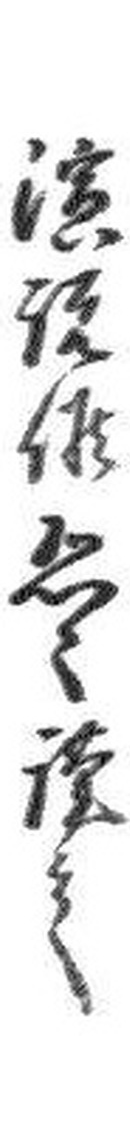演説候恐々謹言
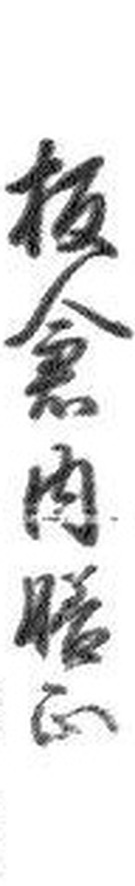板倉内膳正
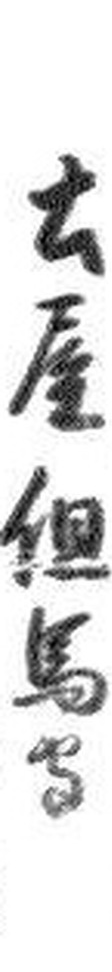土屋但馬守
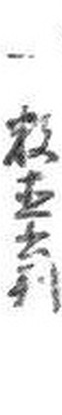数直書判
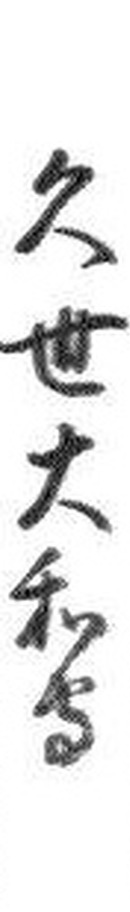久世大和守
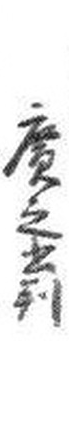広之書判
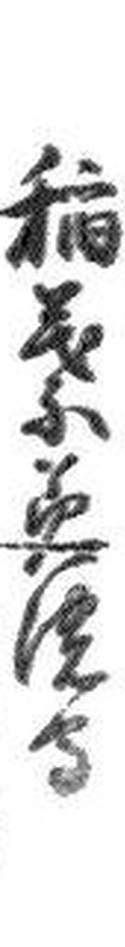稲葉美濃守
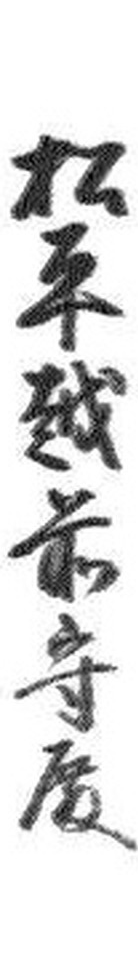松平越前守殿
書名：家譜 八 光通公 従寛文十年到同十二年
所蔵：福井県文書館 Fukui Prefectural Archives
